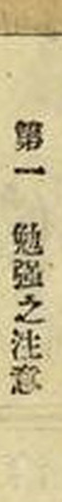第一勉強之注意
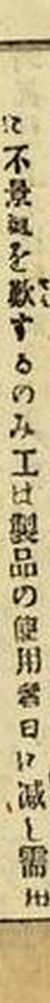に不景気を歎するのみ工は製品の使用者日に減し需用
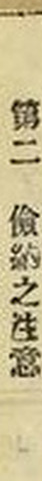第二倹約之注意
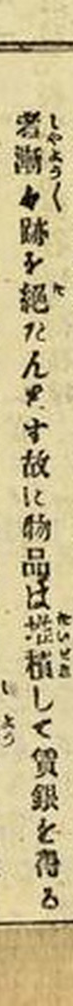者漸々跡を絶たんとす故に物品は堆積して賃金を得る
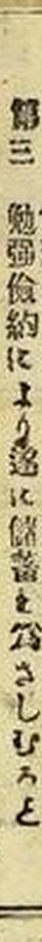第三勉強倹約により遂に儲蓄を為さしむること
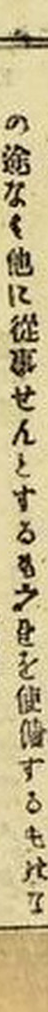の途なく他に従事せんとするも之れを使傭するものな
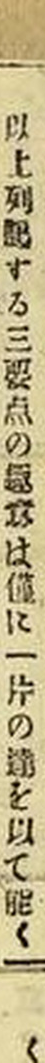以上列記する三要点の趣意は僅に一片の達を以て能く
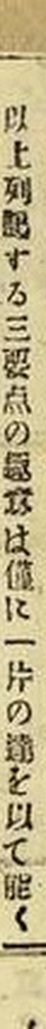以上列記する三要点の趣意は僅に一片の達を以て能く
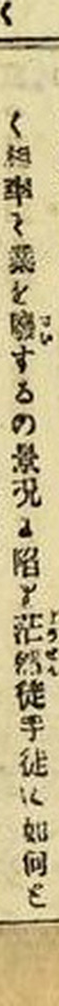く相率て業を廃するの景況に陥り茫然徒手徒に如何と
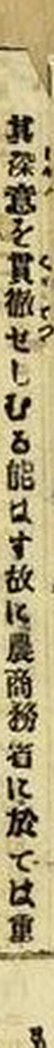其深意を貫徹せしむる能はす故に農商務省に於ては重
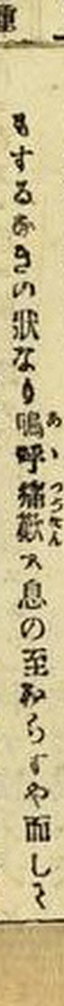もするなきの状なり嗚呼痛歎息の至ならすや而して
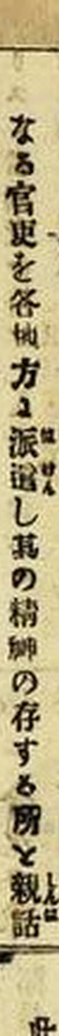なる官吏を各地方に派遣し其の精神の存する所を親話
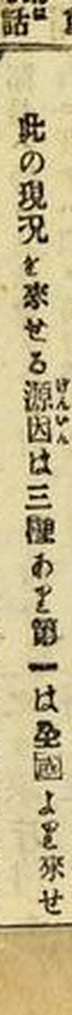此の現況を来せる源因は三種あり第一は全国より来せ
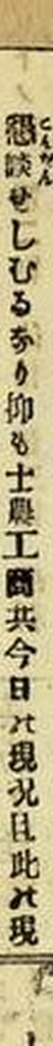懇談せしむるなり抑も士農工商共今日の現況且此の現
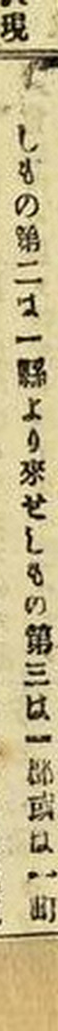しもの第二は一県より来せしもの第三は一郡或は一町
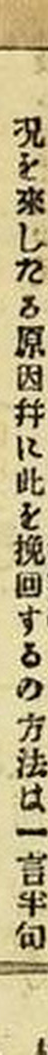況を来したる原因并に此を挽回するの方法は一言半句
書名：温古集 五巻
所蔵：福井県文書館 Fukui Prefectural Archives
